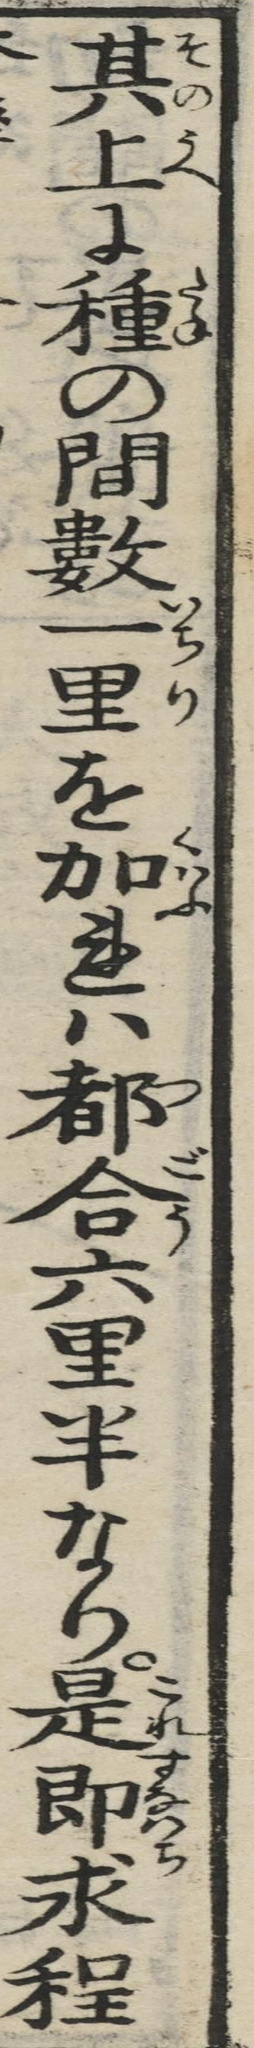其上に種の間数一里を加れは都合六里半なり。是即求程
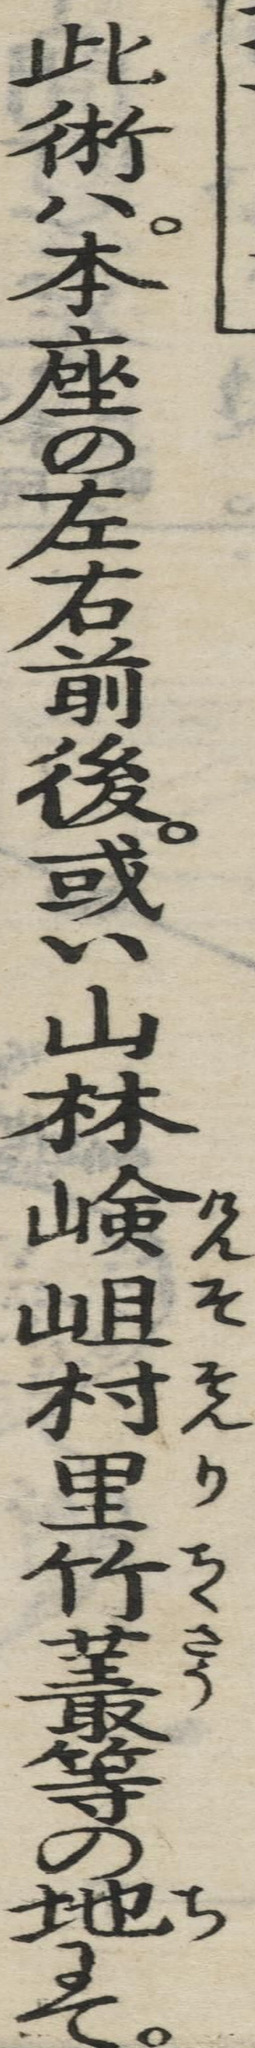此術は。本座の左右前後。或は山林険岨村里竹叢等の地にて。
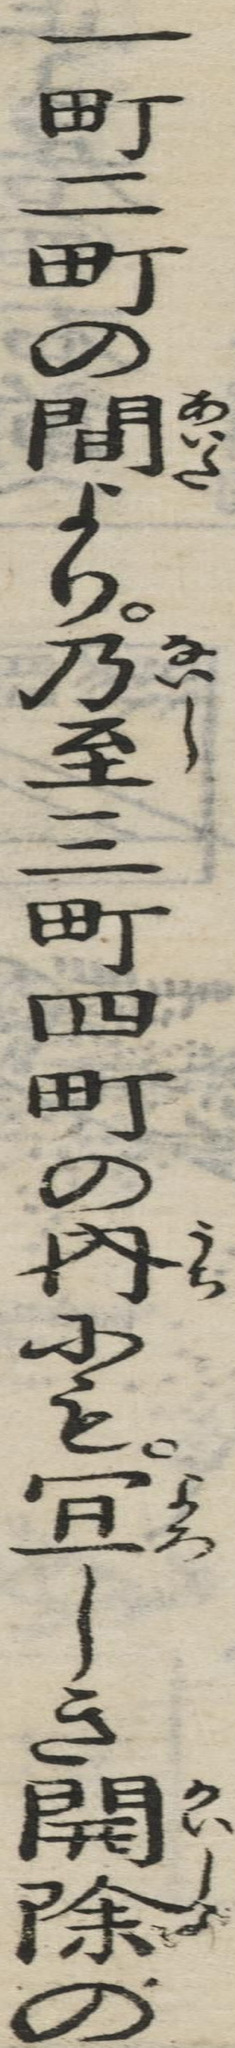一町二町の間より。乃至三町四町の内にも。宜しき開除の
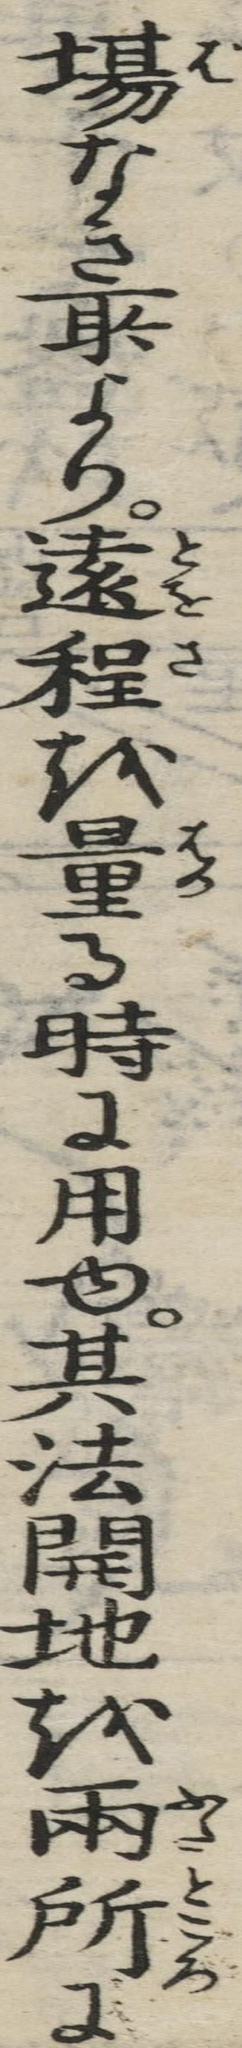場なき所より。遠程を量る時に用ね。其法開地を兩所に
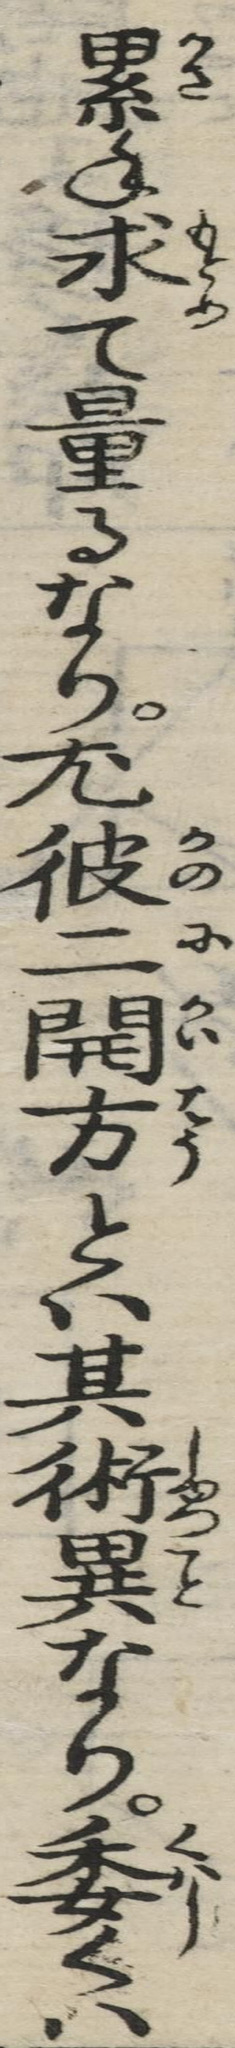累ね求て量るなり。尤彼二開方とは其術異なり。委くは
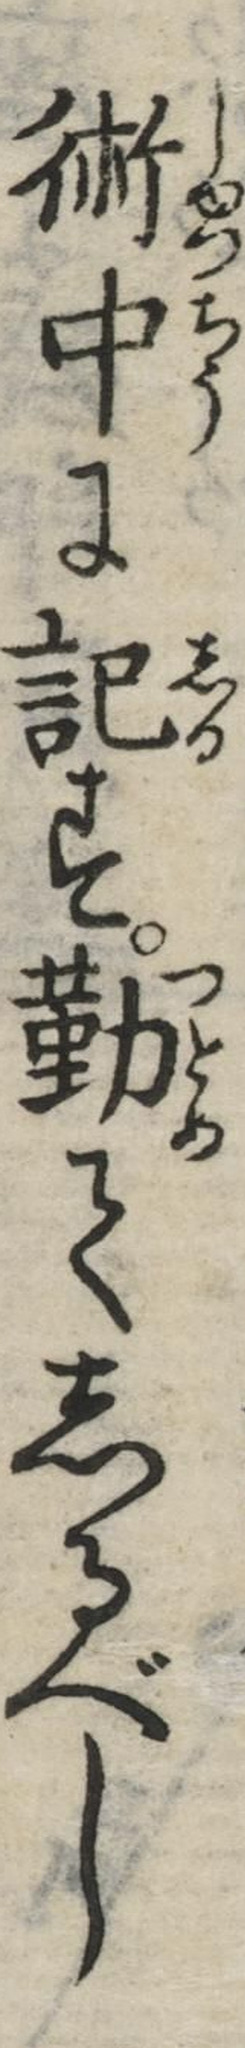術中に記す。勤てしるべし
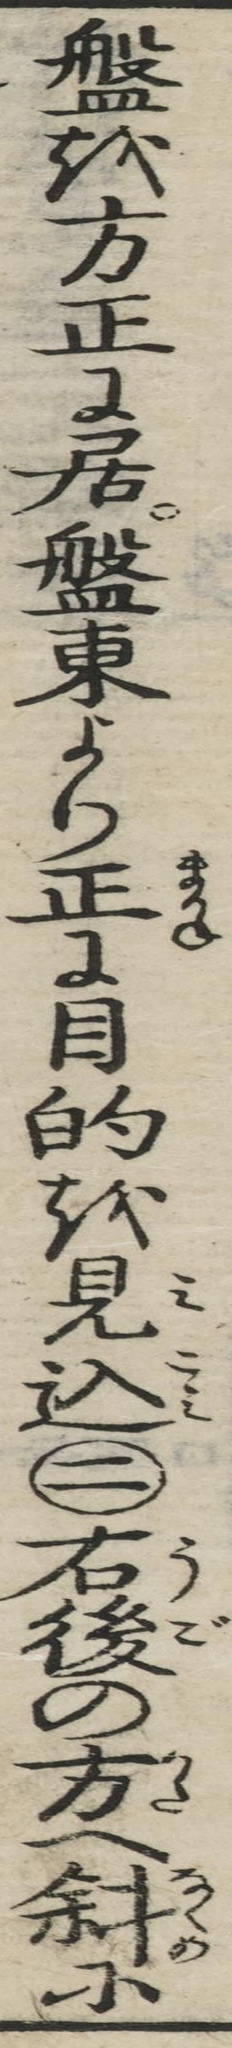盤を方正に居。盤東より正に目的を見込㊁右後の方へ斜に

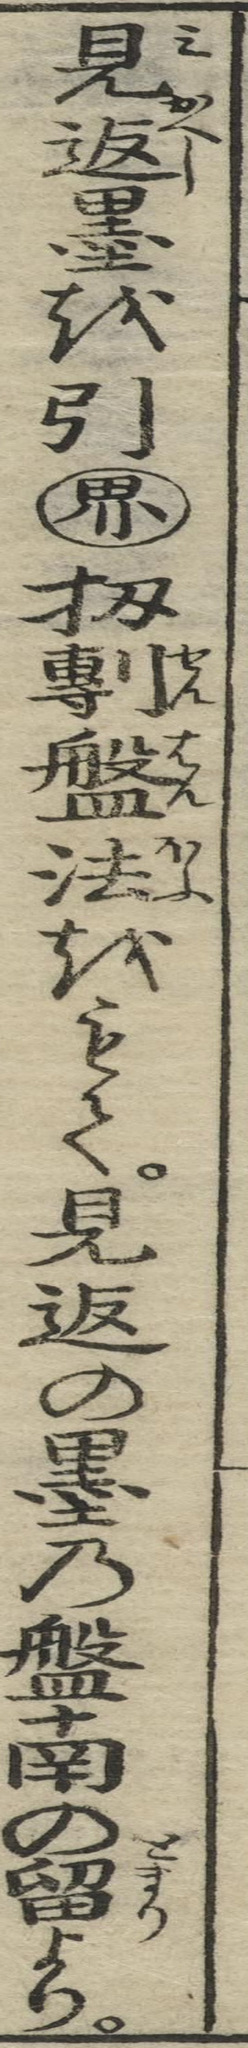見返墨を引界扨剸盤法をもて。見返の墨の盤南の留より。
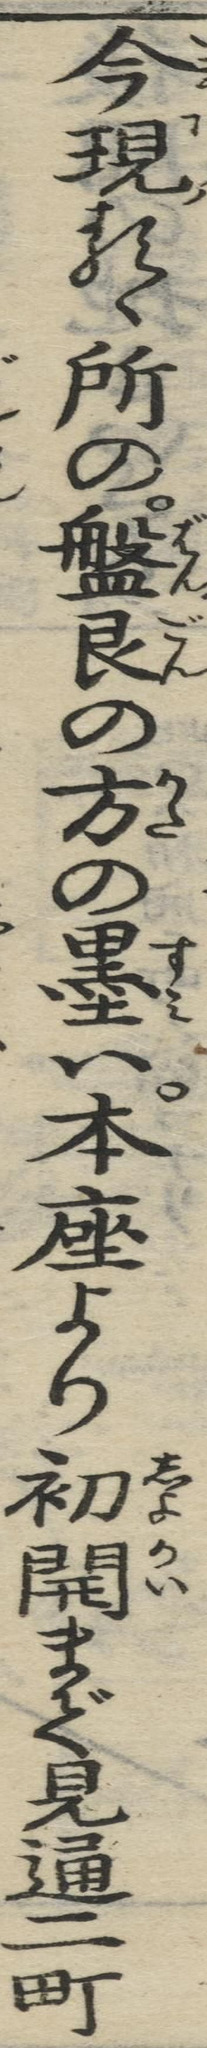今現るゝ所の。盤艮の方の墨は。本座より初開まで見通二町
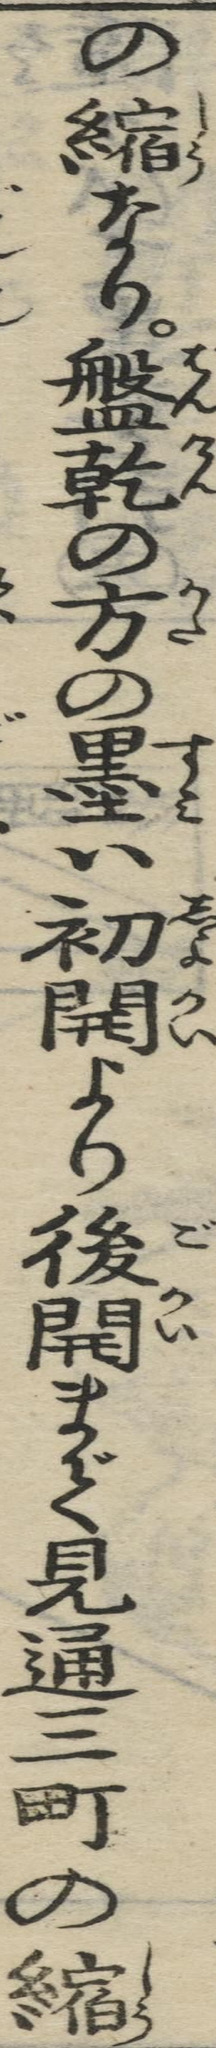の縮なり。盤乾の方の墨は初開より後開まで見通三町の縮
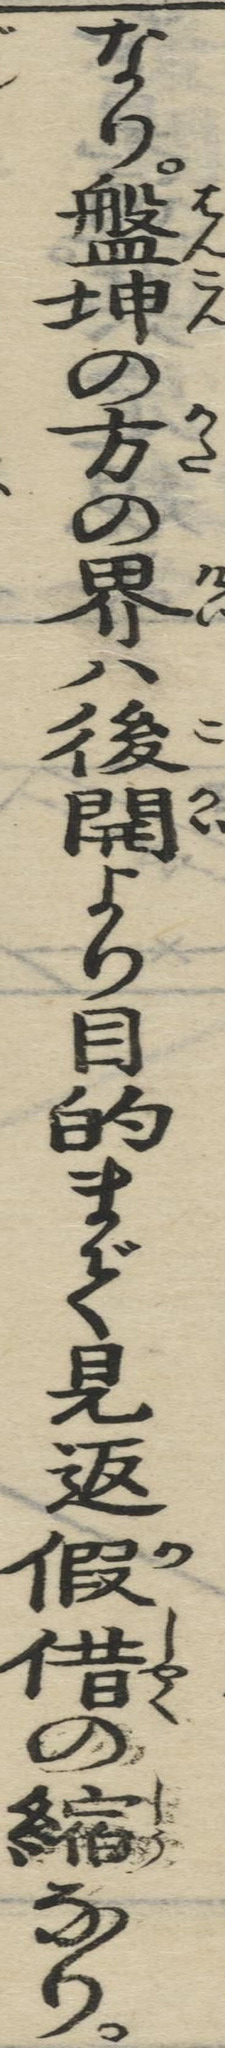なり。盤坤の方の界は後開より目的まで見返仮借の縮なり。
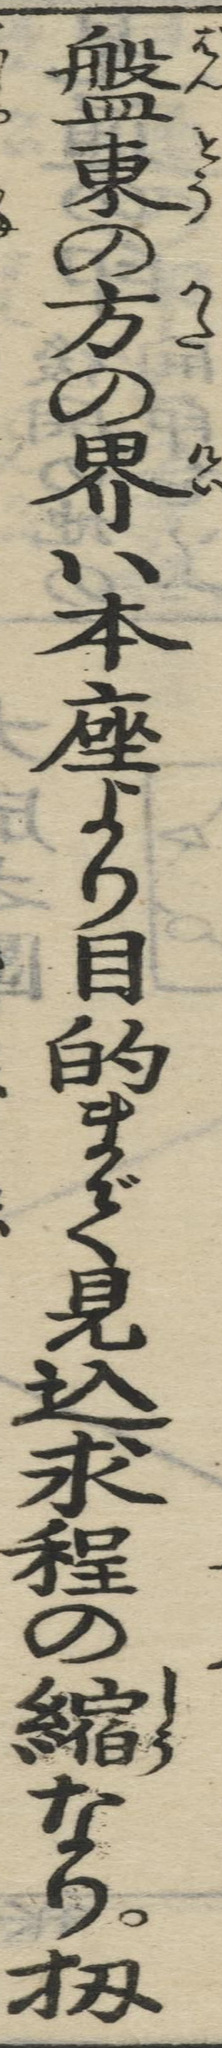盤東の方の界は本座より目的まで見込求程の縮なり。扨
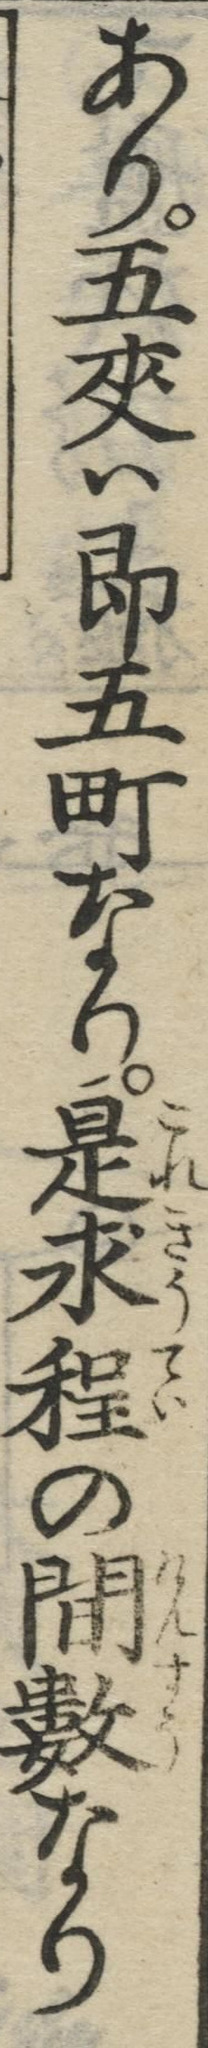あり。五夾は即五町なり。是求程の間数なり
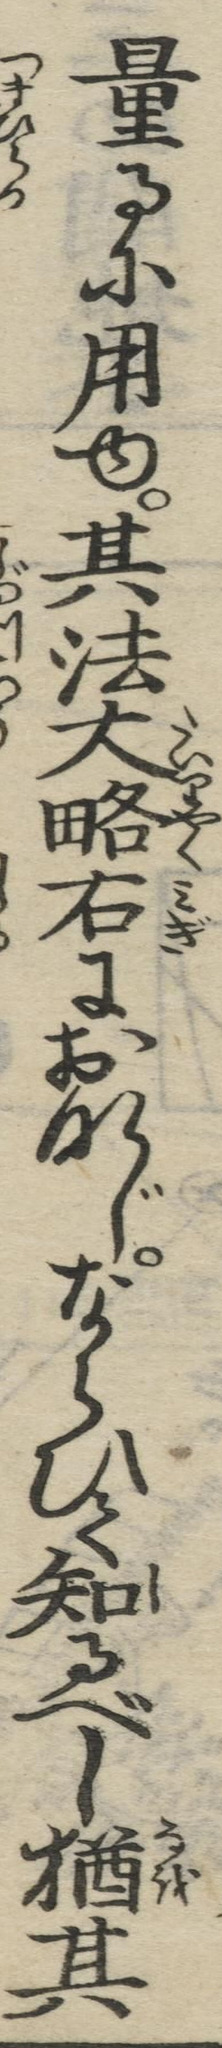量るに用ゆ。其法大略右におなじ。ならひて知るべし猶其
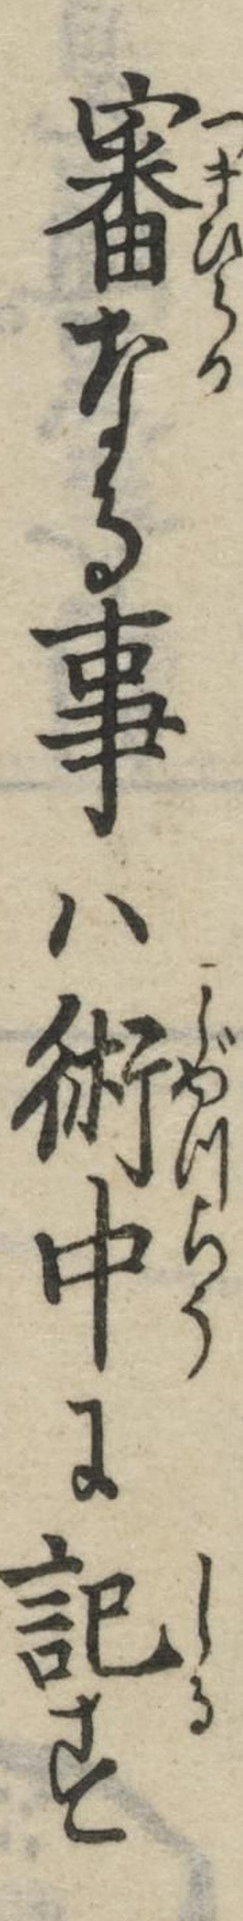審なる事は術中に記す
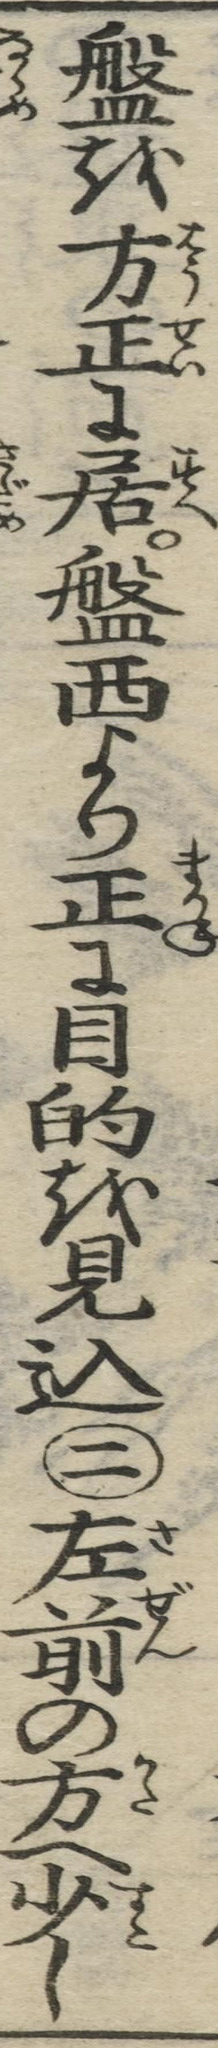盤を方正に居。盤西より正に目的を見込㊁左前の方へ少し
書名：量地指南　巻之二（内題）
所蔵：東京大学地震研究所図書室 Earthquake Research Institute Library, The University of Tokyo, JAPAN
